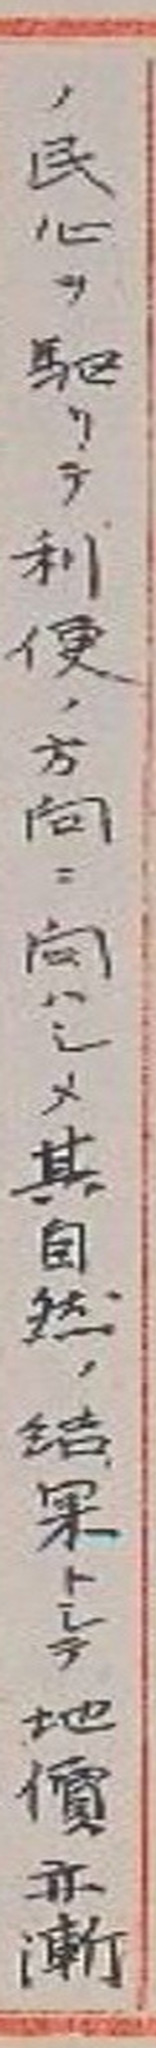ノ民心ヲ駆リテ利便ノ方向ニ向ハシメ其自然ノ結果トシテ地価亦漸

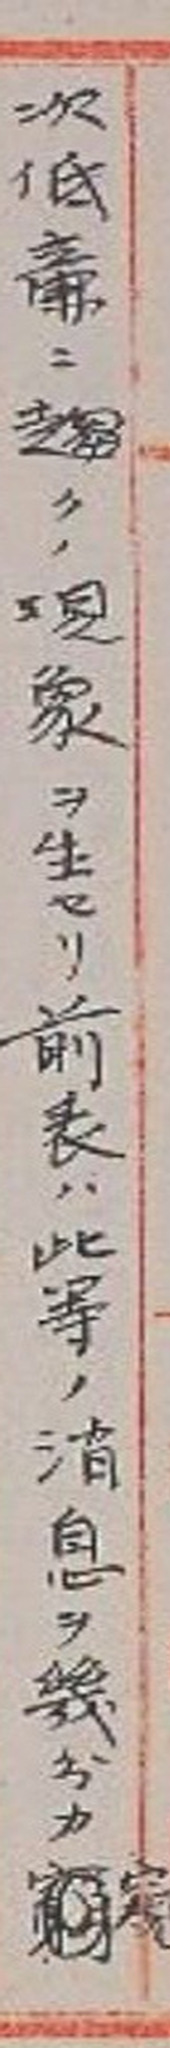次低廉ニ趨クノ現象ヲ生セリ前表ハ此等ノ消息ヲ幾分カ窺
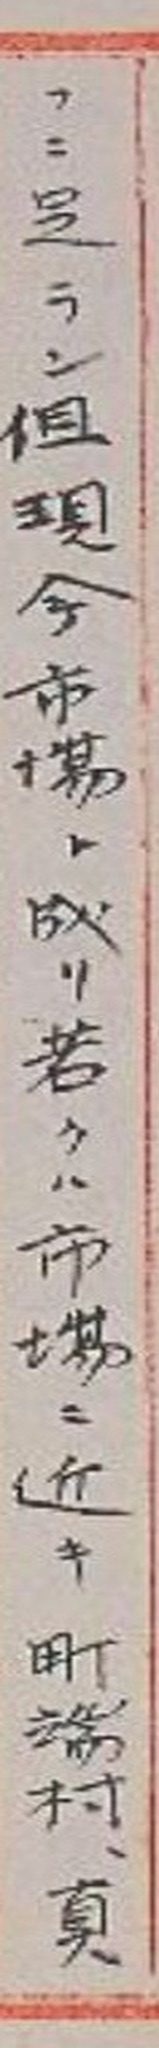フニ足ラン但現今市場ト成リ若クハ市場ニ近キ町端村、真
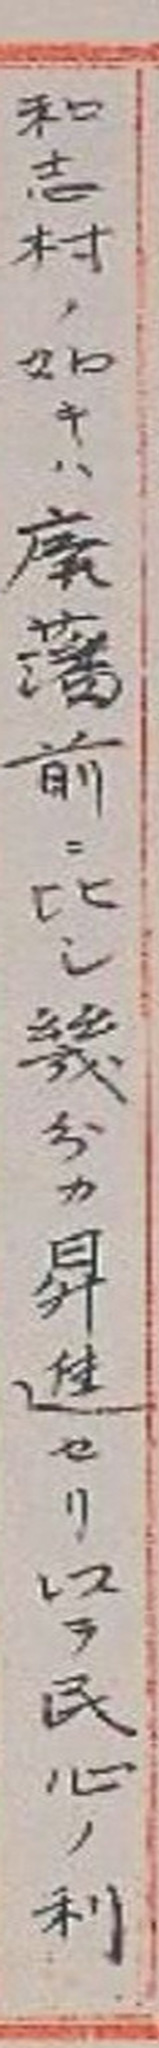和志村ノ如キハ廃藩前ニ比シ幾分カ昇進セリ以テ民心ノ利
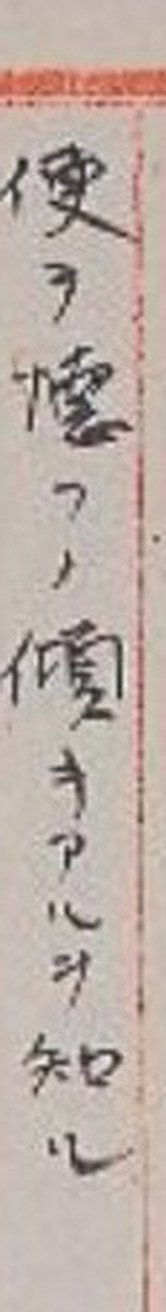便ヲ懐クノ傾キアルヲ知ル
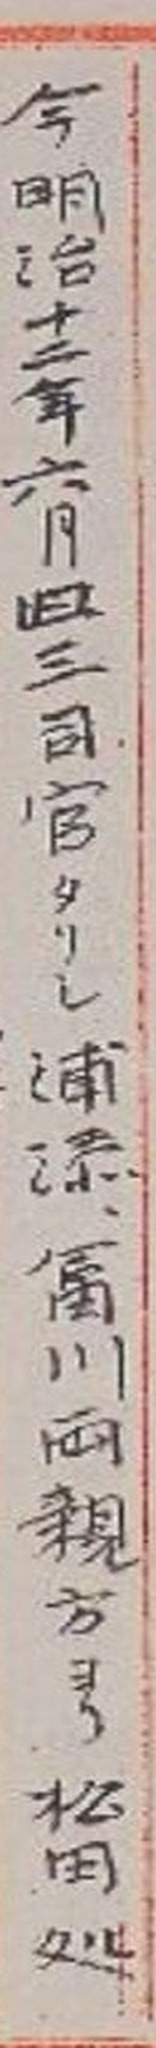今明治十二年六月旧三司官タリシ浦添、冨川両親方ヨリ松田処
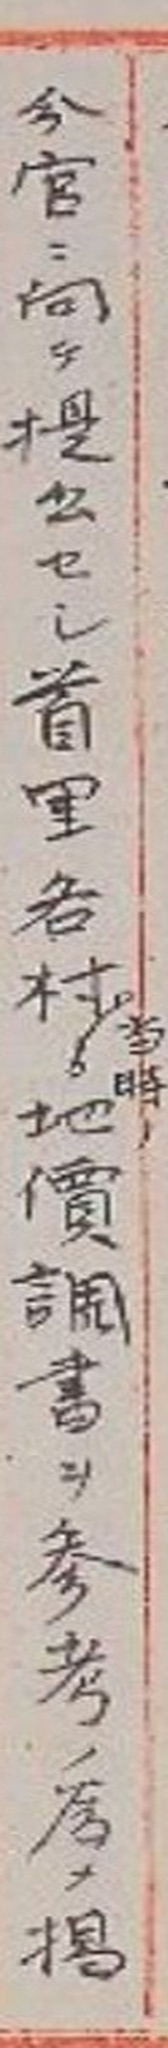分官ニ向テ提出セシ首里各村当時ノ地価調書ヲ参考ノ為メ掲
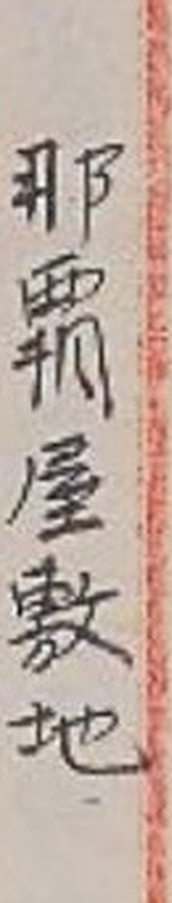那覇屋敷地
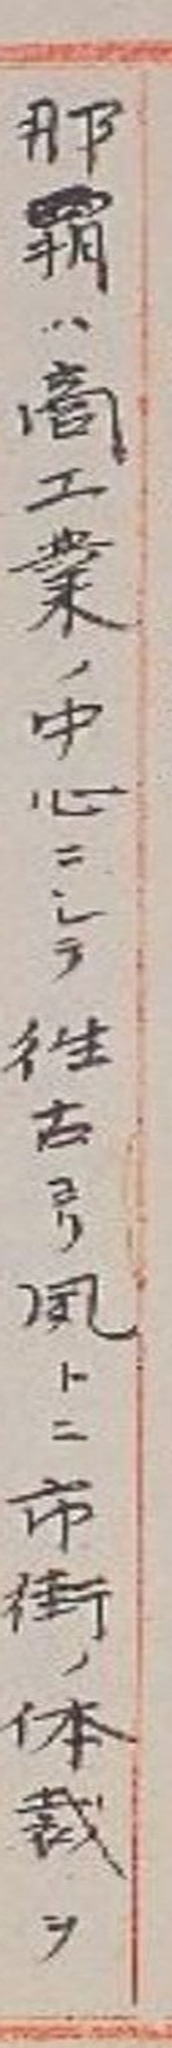那覇ハ商工業ノ中心ニシテ往古ヨリ夙トニ市街ノ体裁ヲ
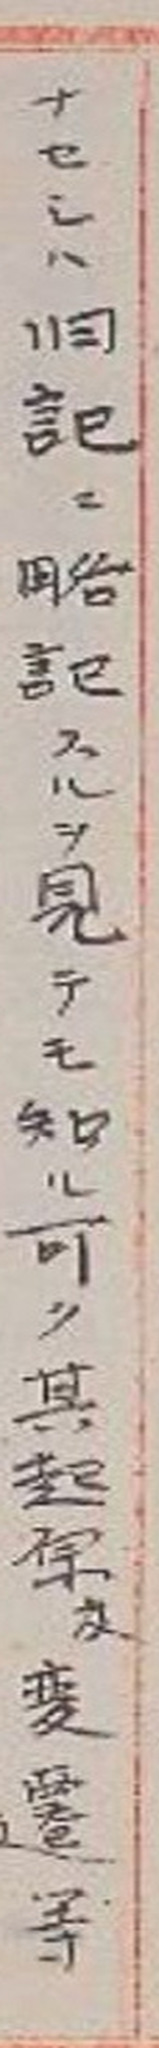ナセシハ旧記ニ略記スルヲ見テモ知ル可ク其起原及変遷等
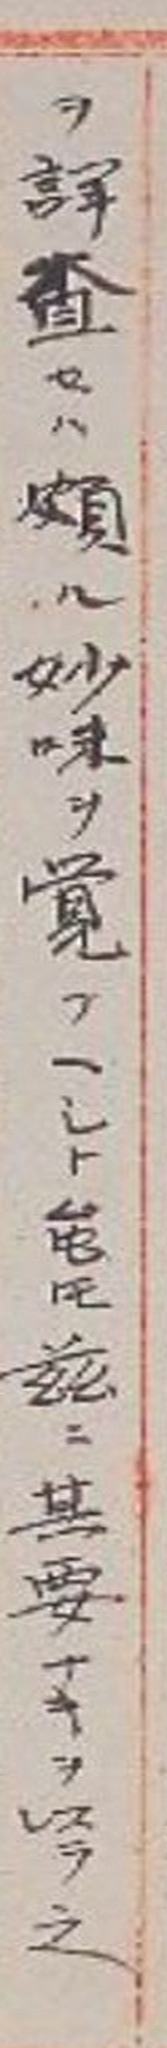ヲ詳査セハ頗ル妙味ヲ覚フヘシト雖トモ茲ニ其要ナキヲ以テ之
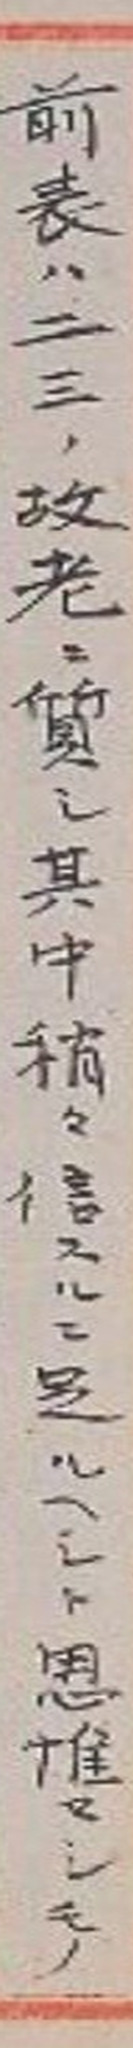前表ハ二三ノ故老ニ質シ其中稍々信スルニ足ルヘシト思惟セシモノ

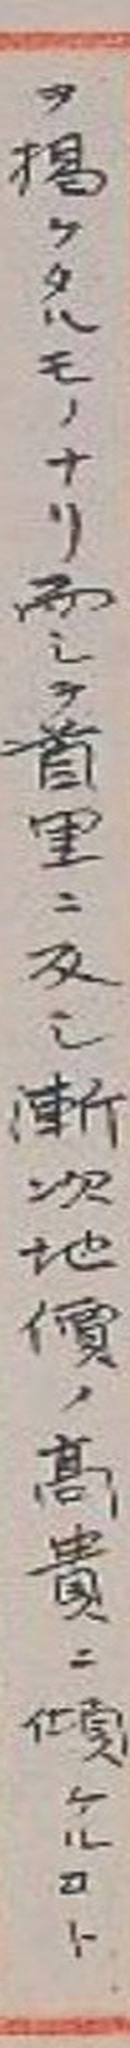ヲ掲ケタルモノナリ而シテ首里ニ反シ漸次地価ノ高貴ニ傾ケルコト
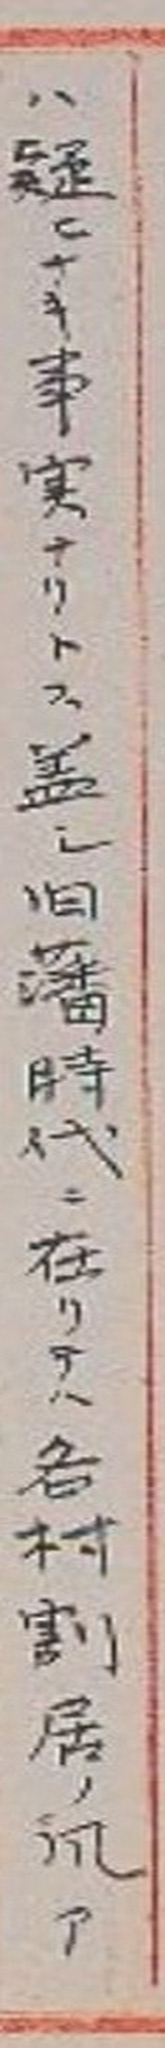ハ疑ヒナキ事実ナリトス蓋シ旧藩時代ニ在リテハ各村割居ノ風ア
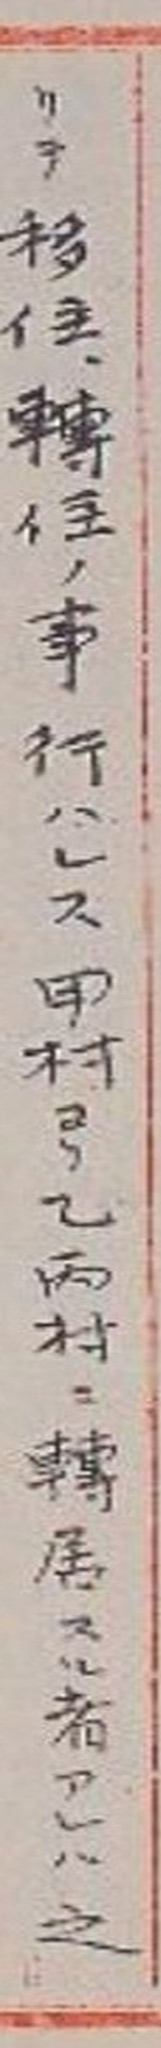リテ移住、転住ノ事行ハレス甲村ヨリ乙丙村ニ転居スル者アレハ之
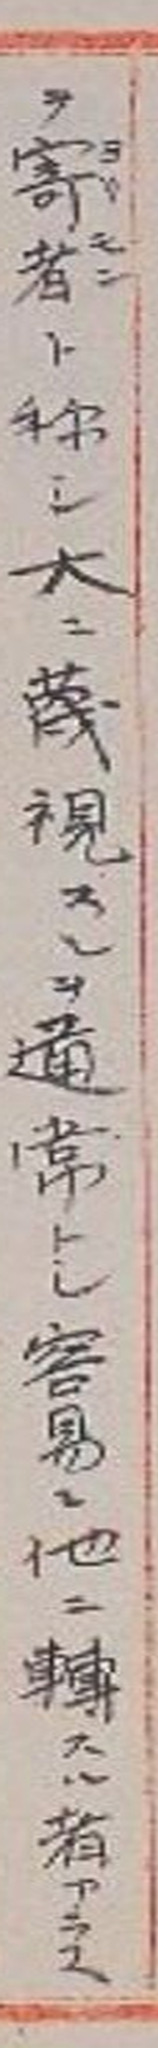ヲ寄者ト称シ大ニ蔑視スルヲ通常トシ容易ニ他ニ転スル者アラス
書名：本県地価ノ高キ理由調書
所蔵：University of the Ryukyus Library
